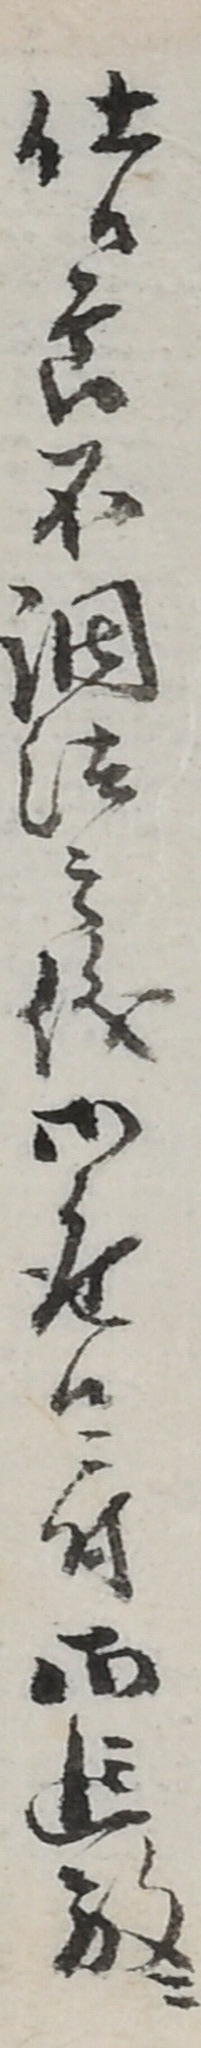仕候節不調法之儀御座候ニ付御追放ニ
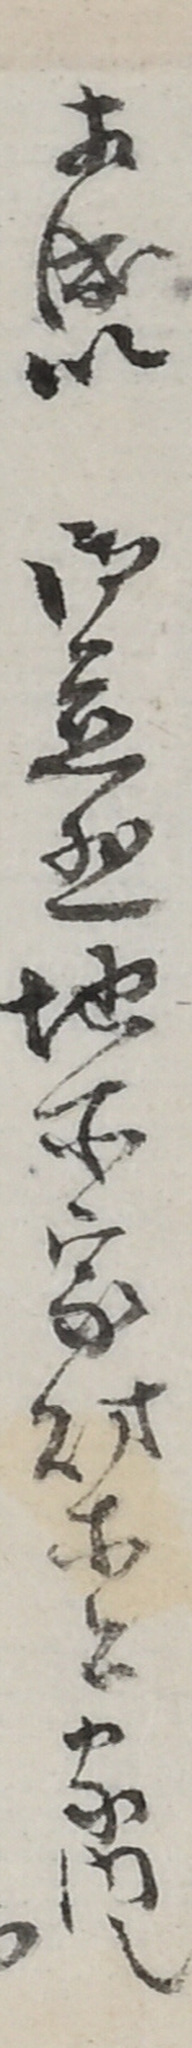相成以御慈悲地所家財等者家内之
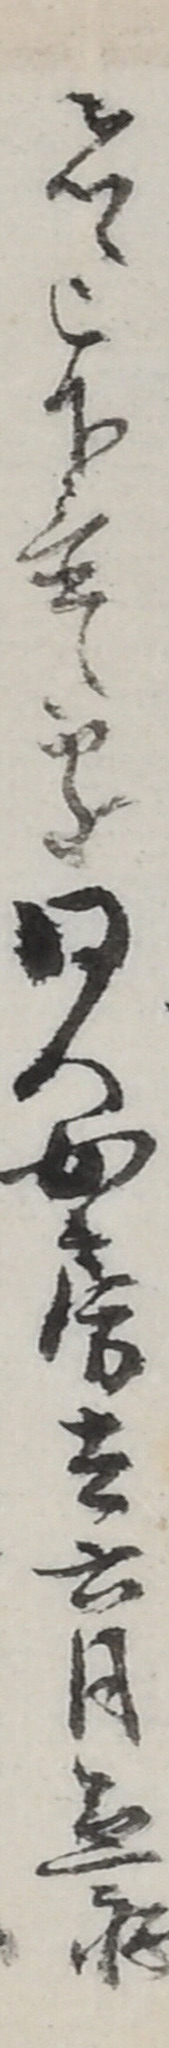者候被下置候処同人女房去六月兼病
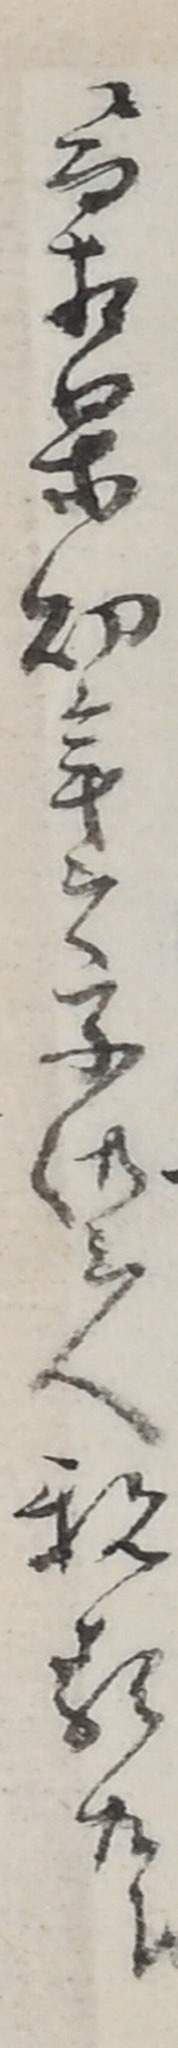ニ而相果初年者子供三人親類共江
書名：百五拾亗（歳）御祝廻村御用手控
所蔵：伊那市立高遠町図書館・合同会社AMANE
